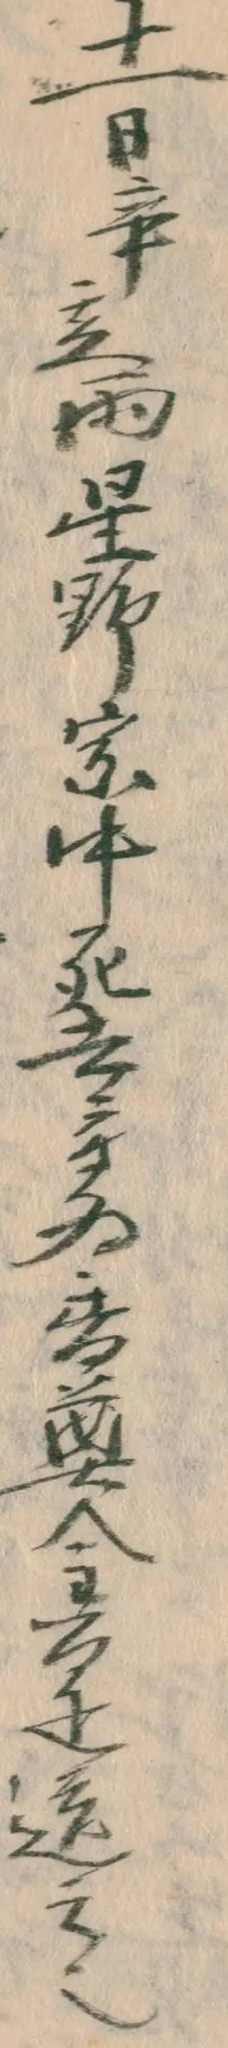十一日辛亥雨星野宗中死去ニ付為香奠金百疋送之也
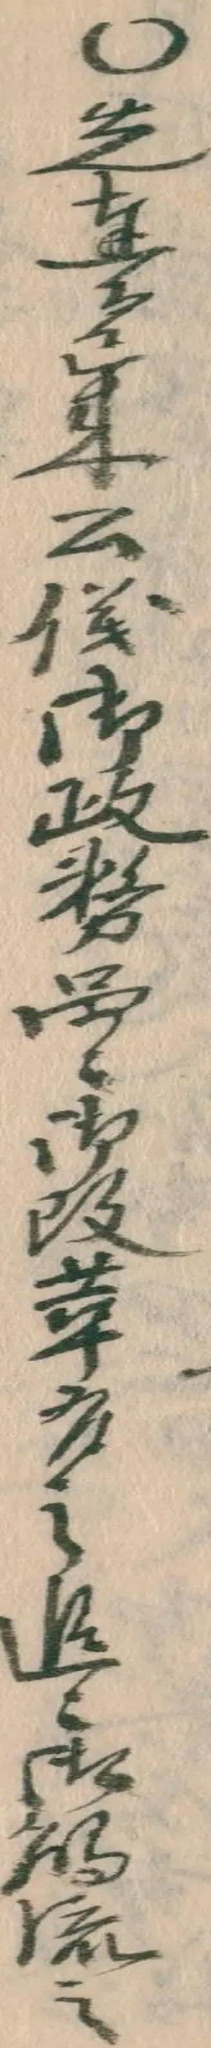〇先達而已来公儀御政務品々御改革有之追々御觸流之
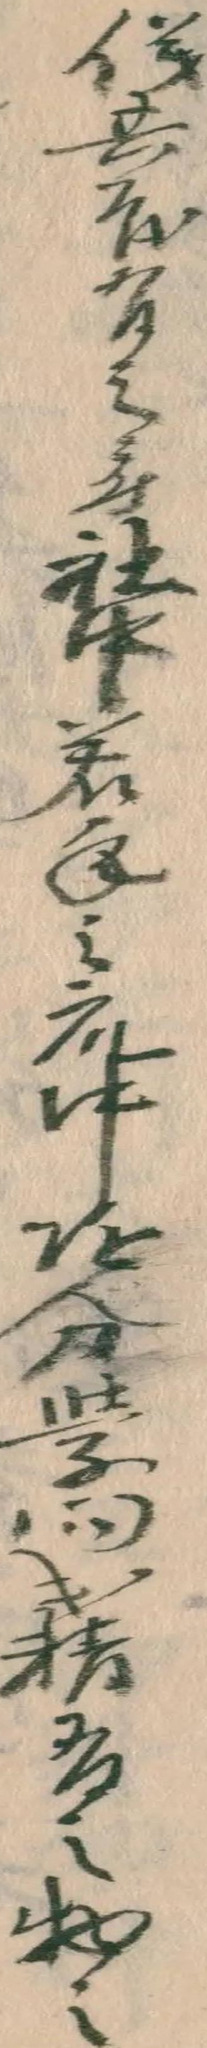儀其も有之ニ付社中若年之衆中随分学問出精有之物之
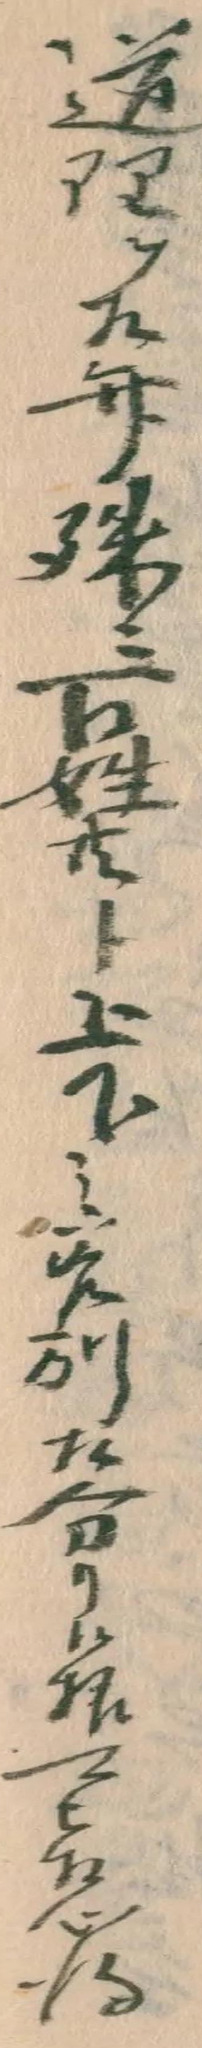道理ヲ相弁殊ニ百姓共ト上下之差別相分り候様可被相心得
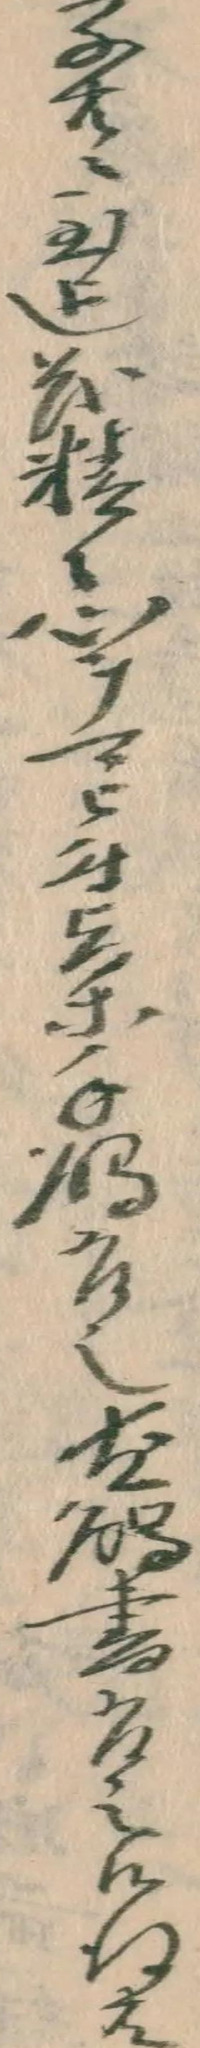子共ニ至迄も精々心ヲ可被付旨等手觸有之尤觸書有之候得は
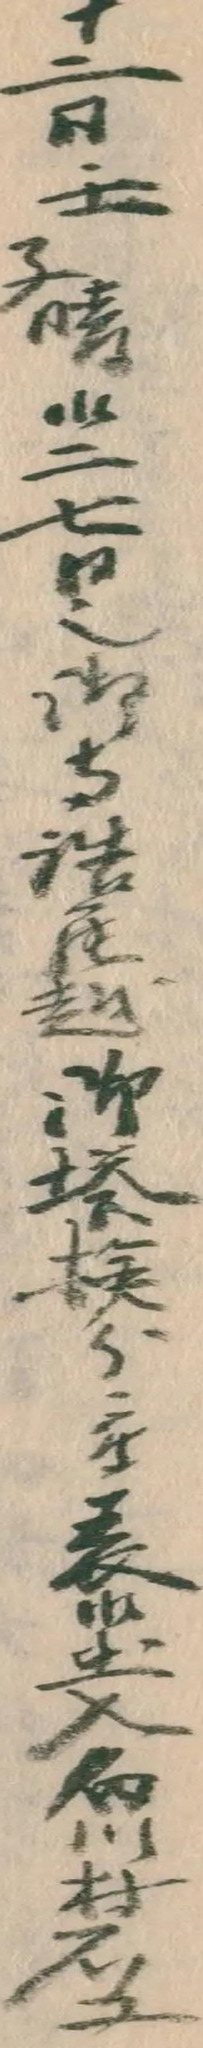十二日壬子晴御二七日也御寺詰罷屋越御塔検分ニ付表御出入白川村石工
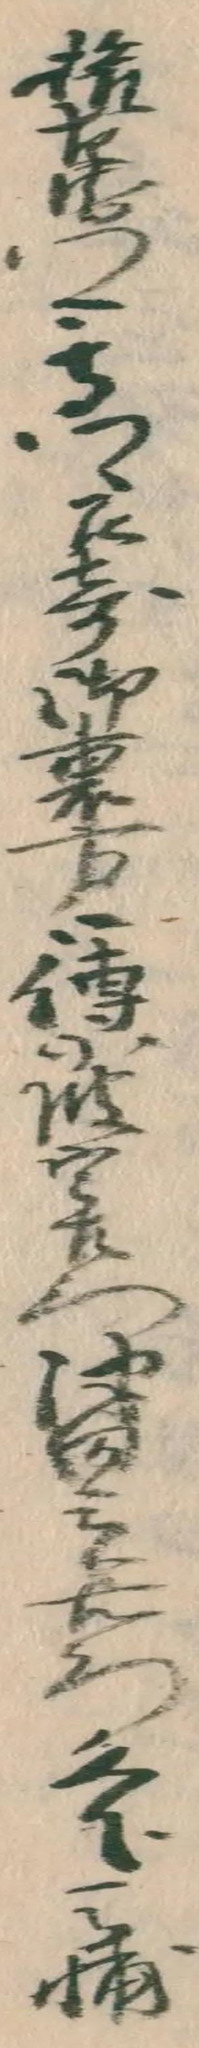権左衛門御寺門へ罷寄御裏方御傳小波宇衛門津田云右衛門久下馬輔
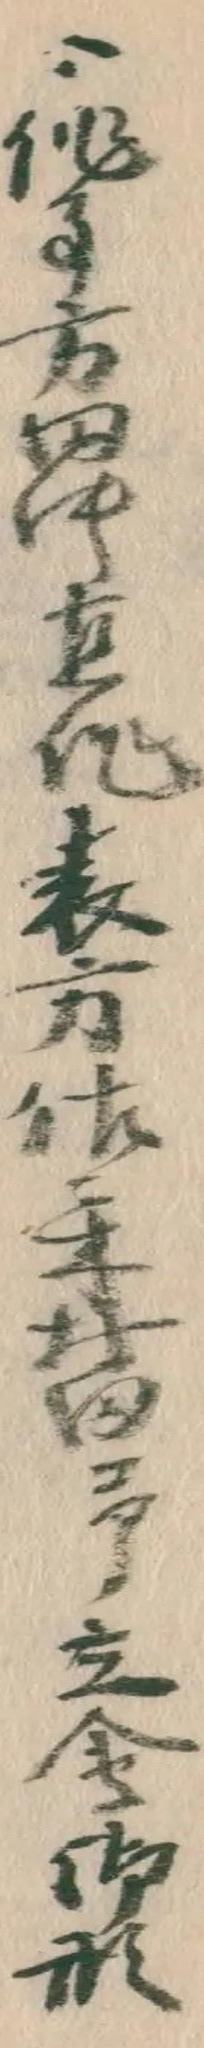御作事方田中直作表方佐主村田予立會御形
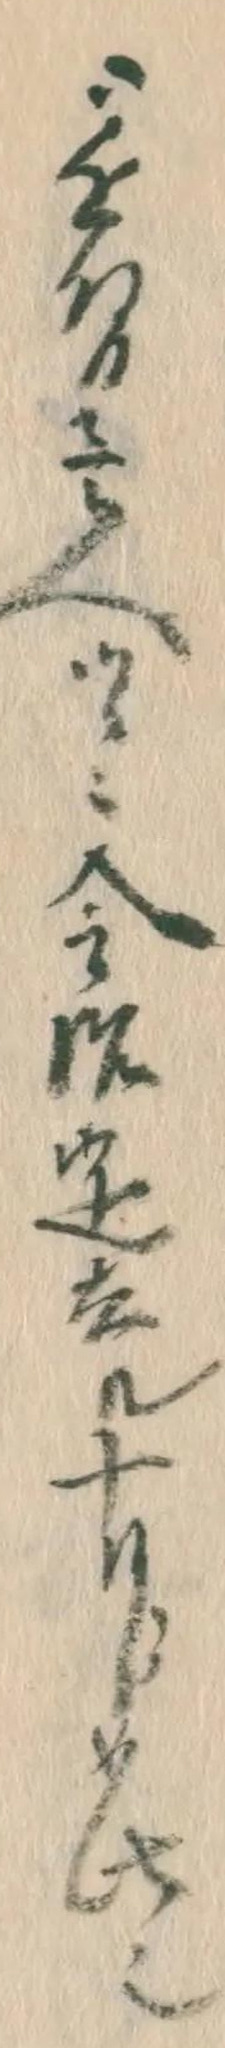御近習壱人ツヽ御令治定去ル十日ゟ如此也
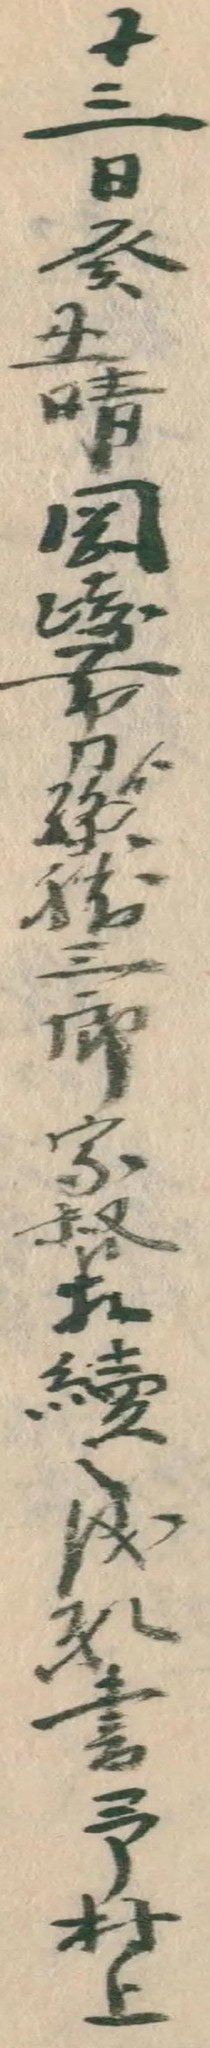十三日癸丑晴岡崎帯刀祢勝三郎家督相續之儀願書予村上
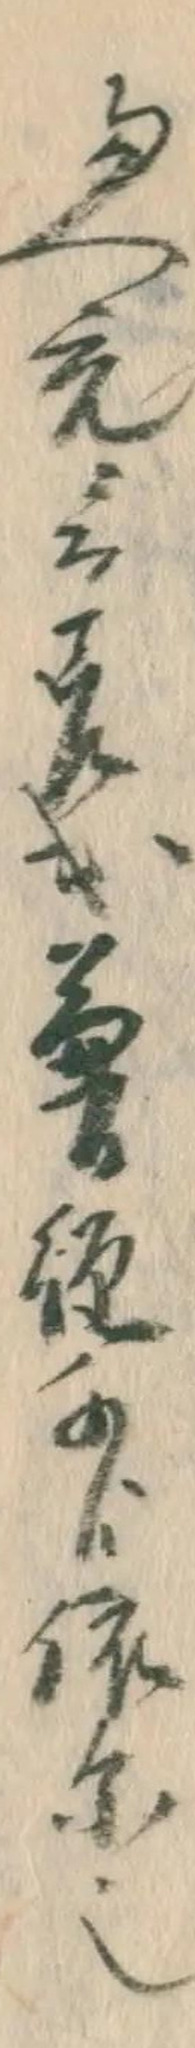両人充ニ而差出兼而経千ゟ依尓也
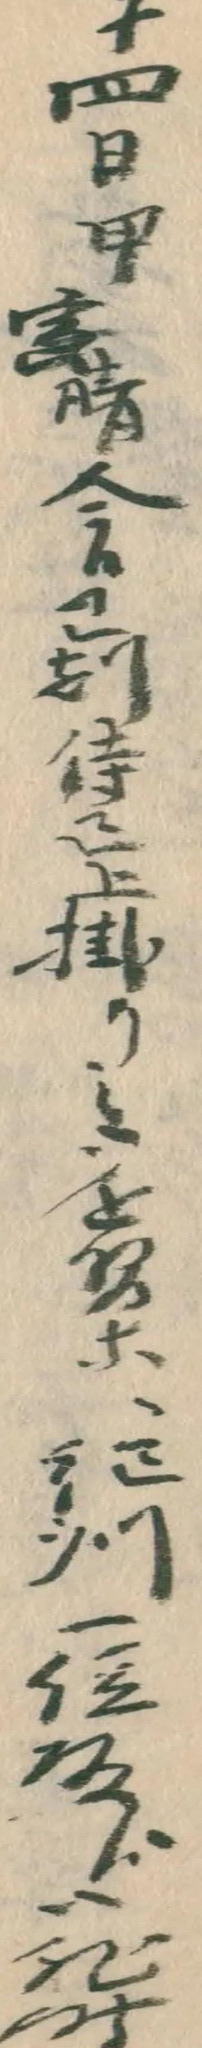十四日甲寅晴今日巳刻待已上掛り之御近習等へ紀州一位殿ゟ御他時
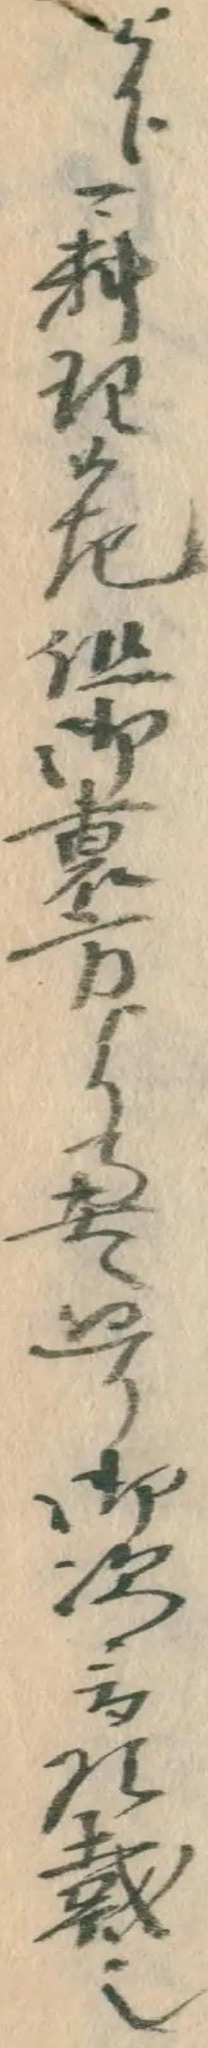被下御料理如左但御裏方より奥へ廻り御次に而頂戴也

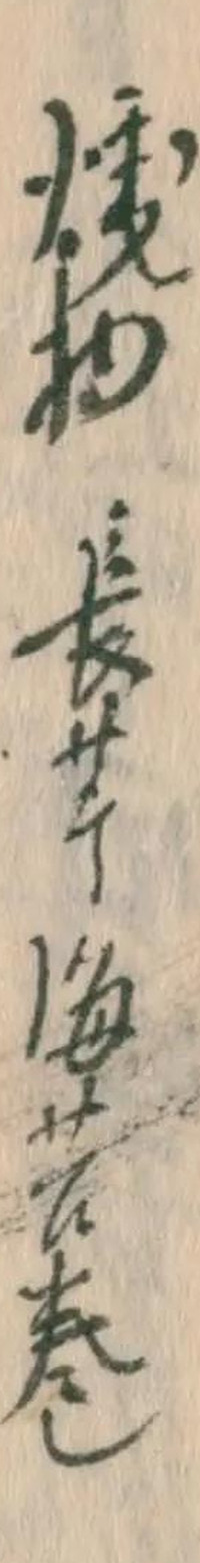焼物長芋海苔巻
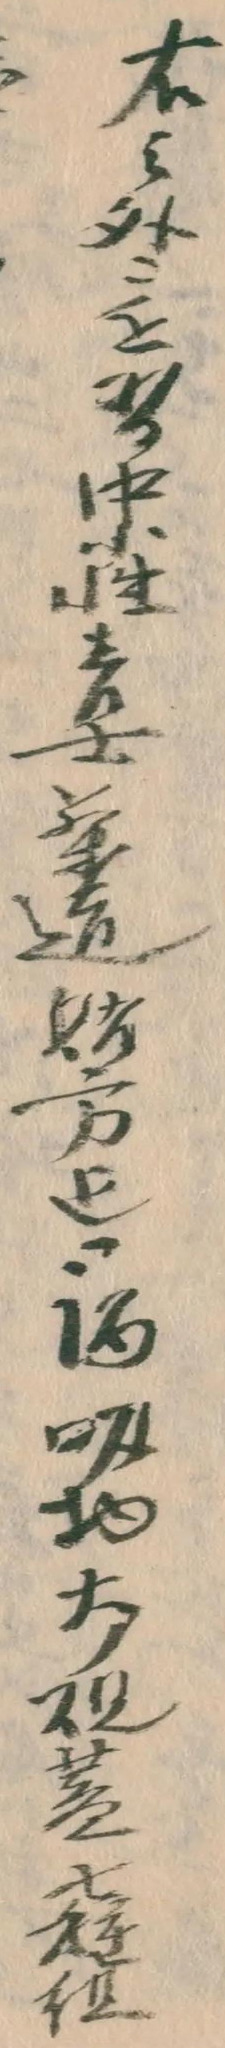右之外ニ近習中小性青士茶道賄方迄御酒吸物大ノ硯蓋七種組
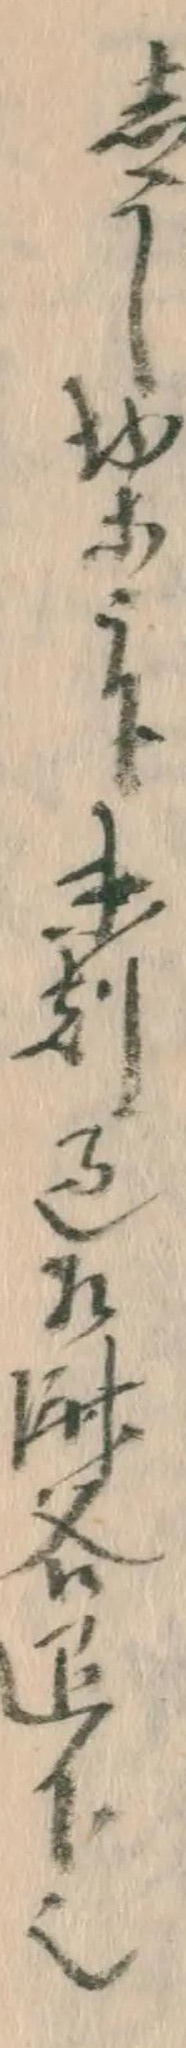したし物等已下未刻過相済各退下也
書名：賀茂社記録. 第69冊
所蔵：国立国会図書館 National Diet Library, JAPAN
